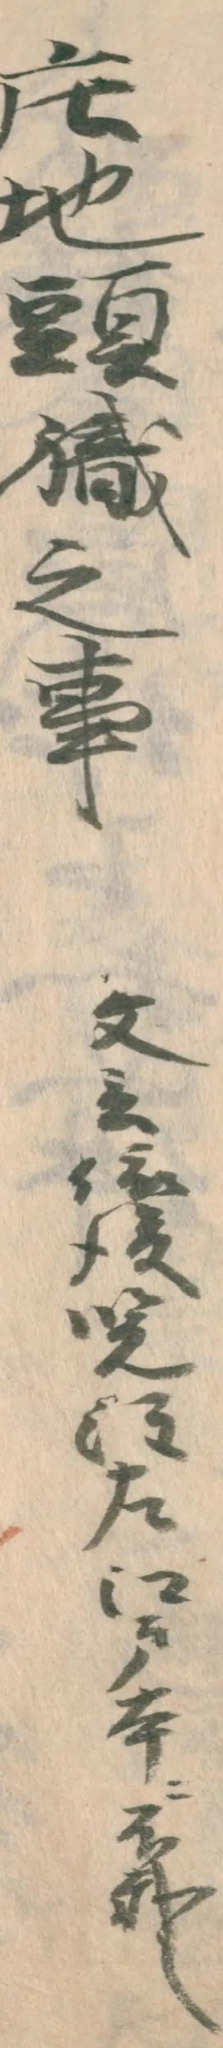庄地頭職之事文言依後覧注左江戸本不載也

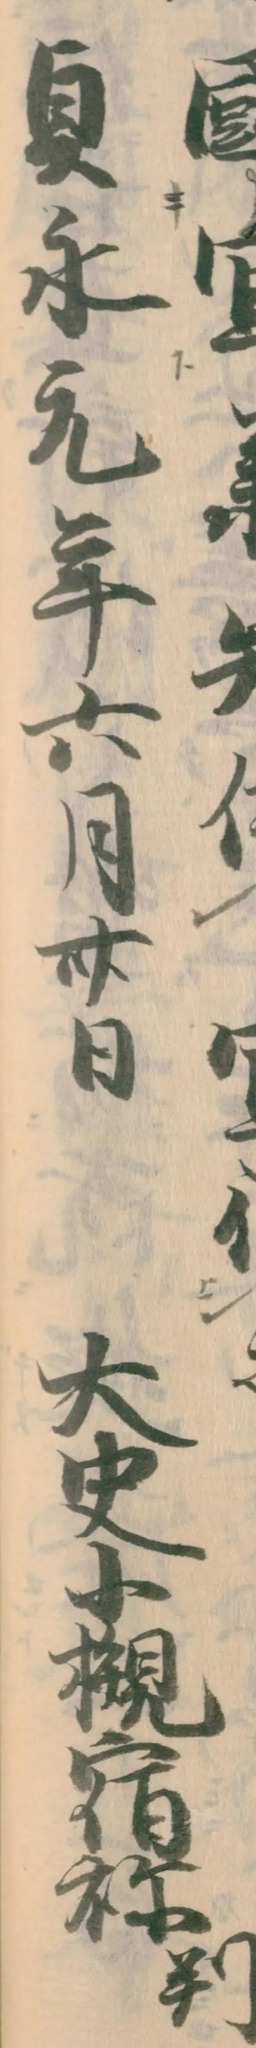貞永元年六月廿日大史小槻宿祢判
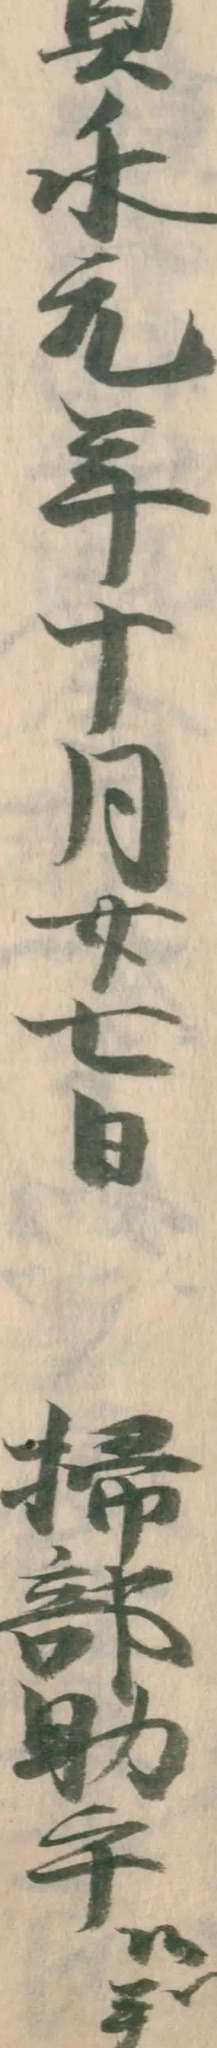貞永元年十月廿七日掃部助平御判

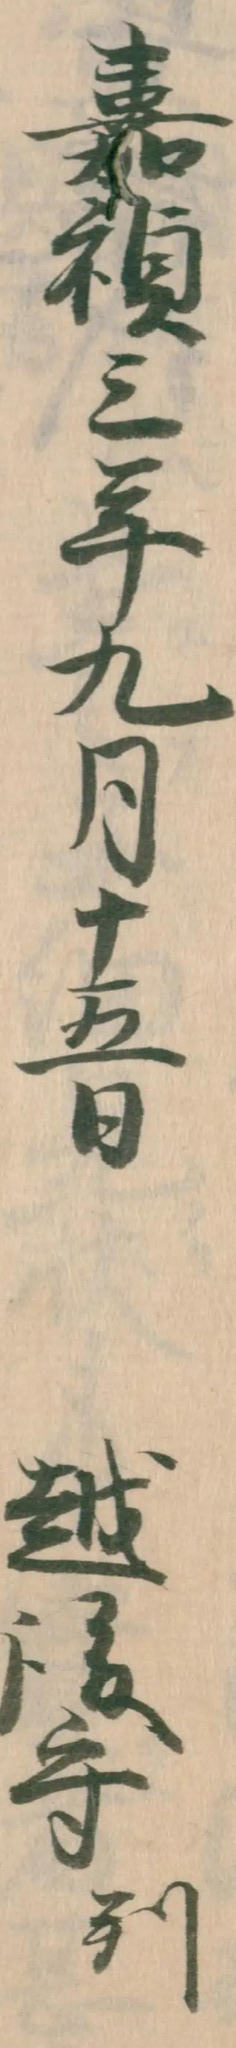嘉禎三年九月十五日越後守判
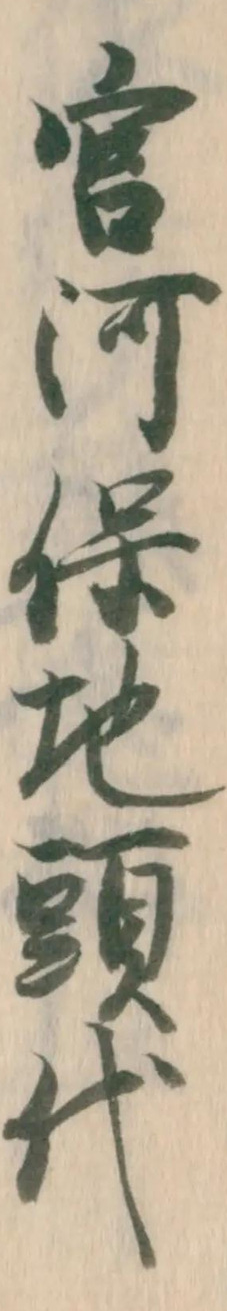宮河保地頭代
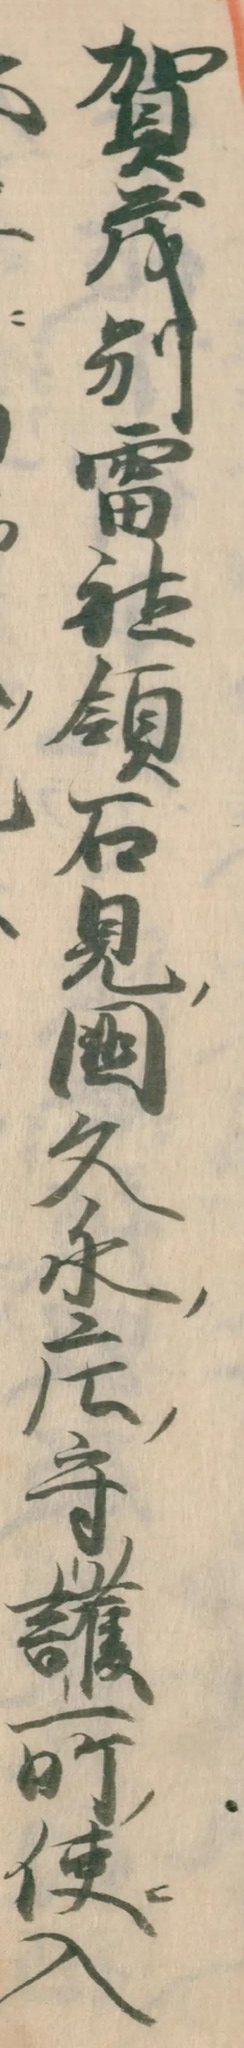賀茂別雷社領石見国久永庄守-護-所使入

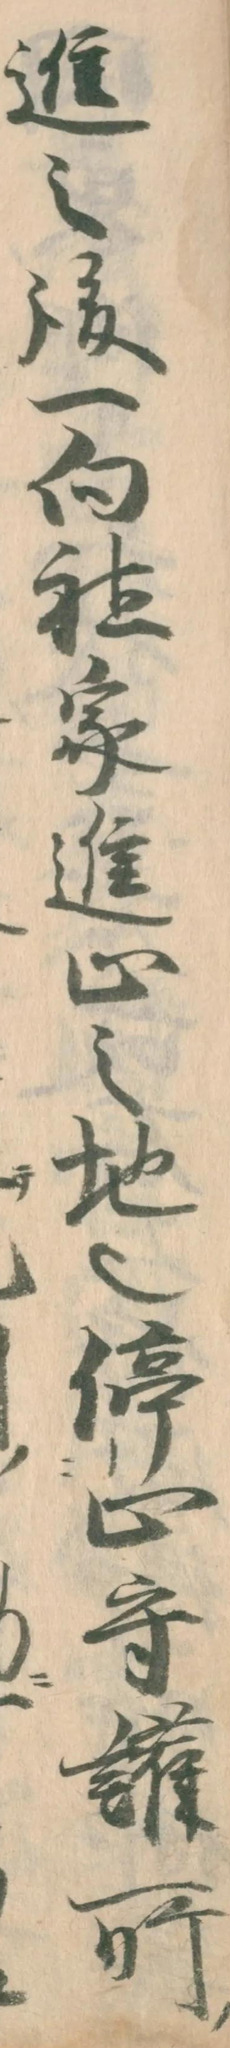進之後一向社家進止之地也停-止守護所
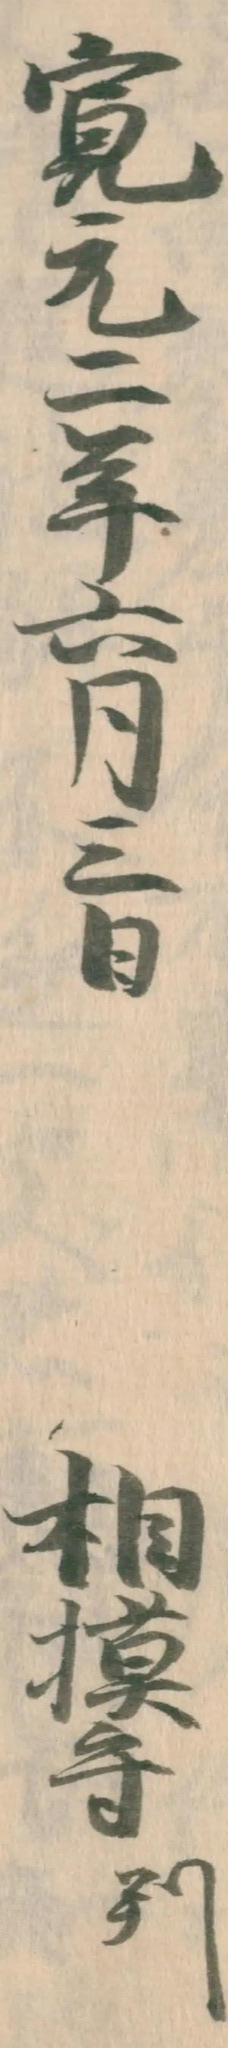寛元二年六月三日相模守判
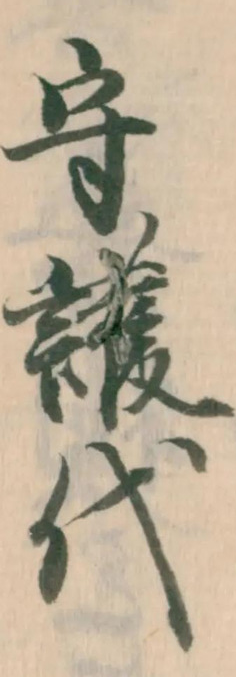守護代
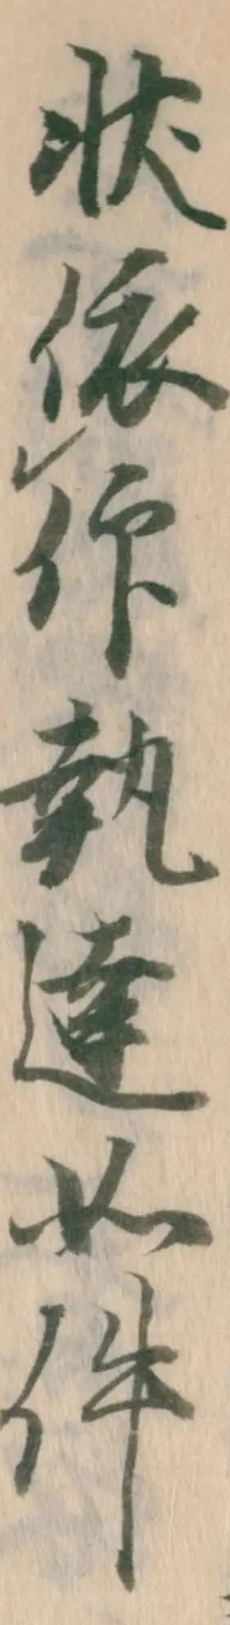状依仰執達如件
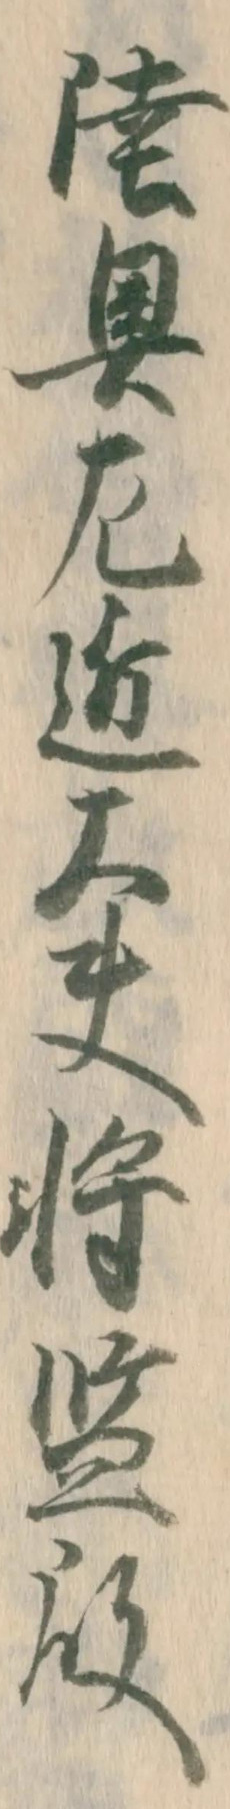陸奥左近大夫将監殿

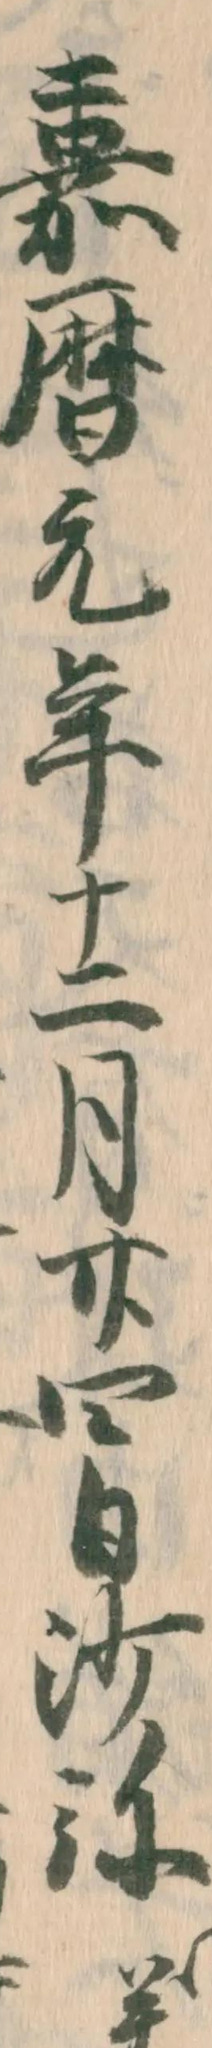嘉暦元年十二月廿四日沙弥判
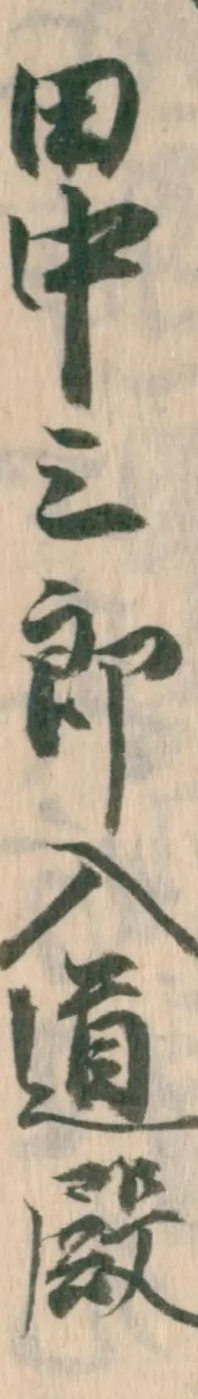田中三郎入道殿
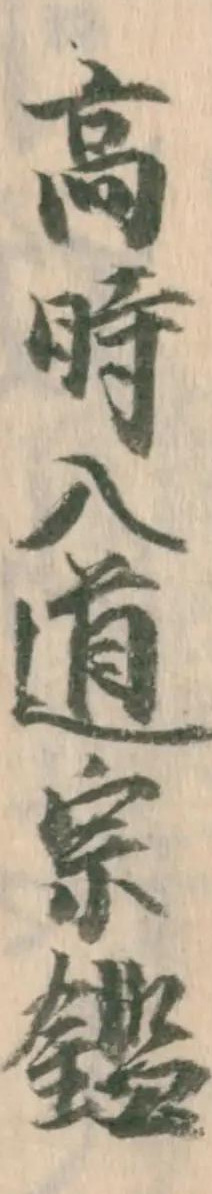高時入道宗鑑
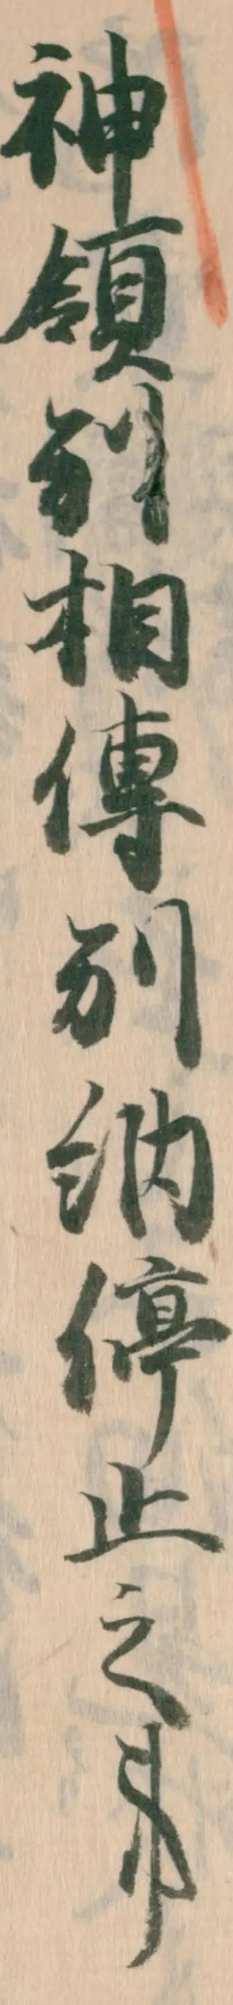神領別相伝別納停止之事
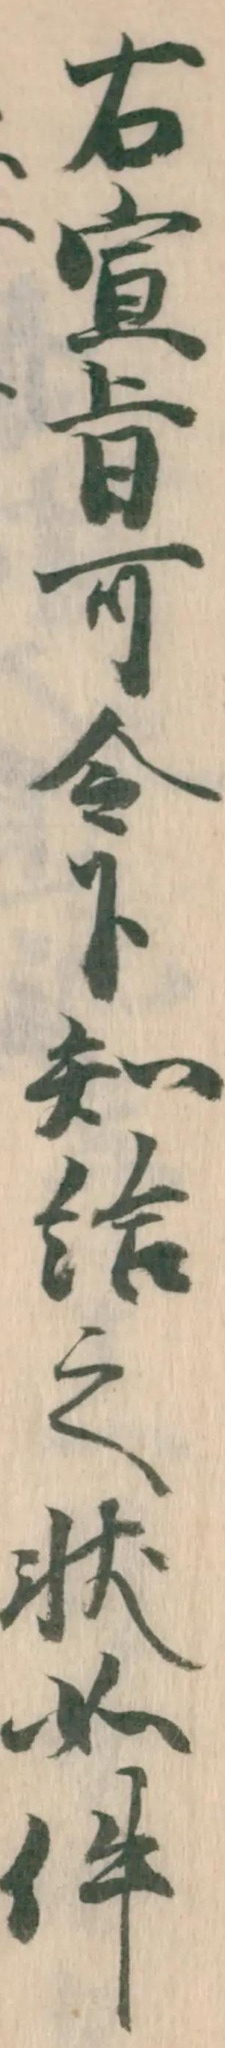右宣旨可令下知給之状如件
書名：賀茂社記録. 第1冊
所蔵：国立国会図書館 National Diet Library, JAPAN
